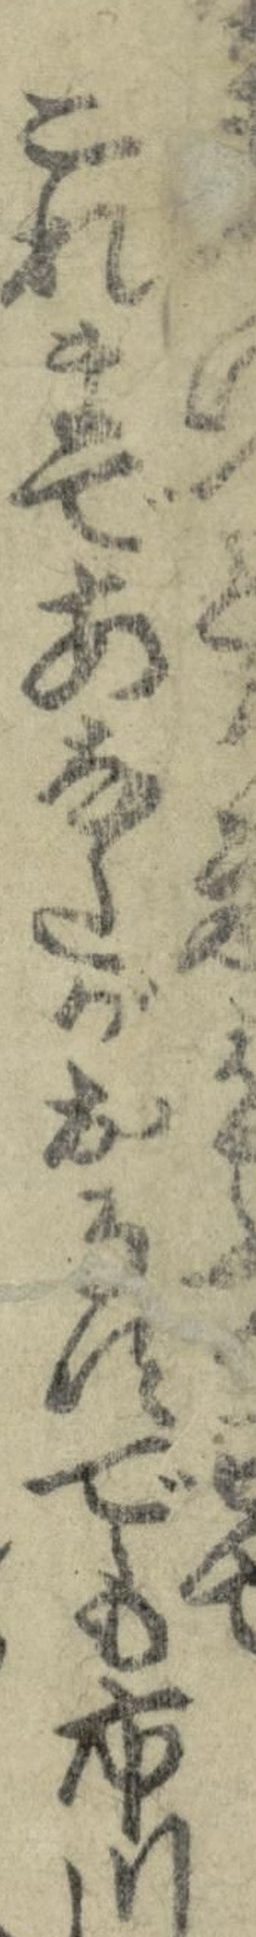これまであなたがおるすでも市川
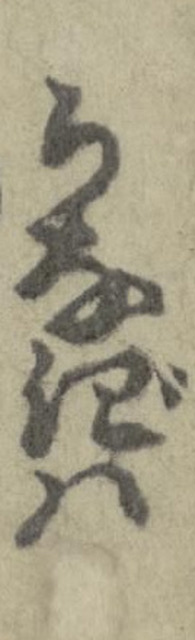うなぎは
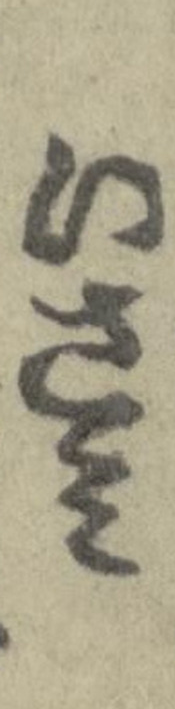いさみ
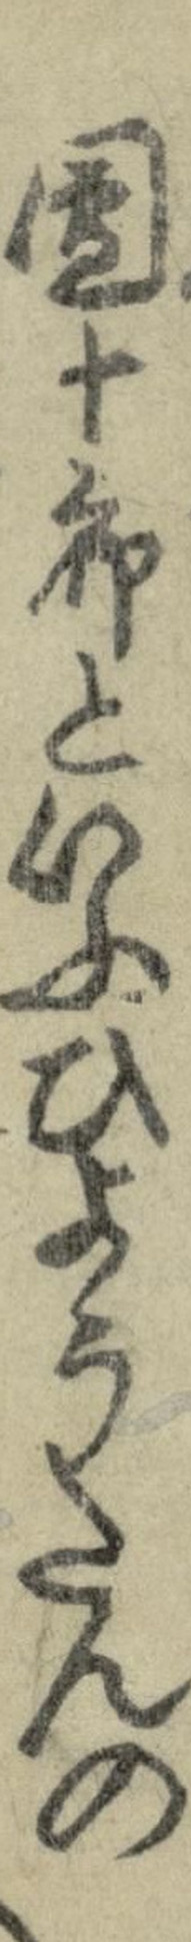団十郎といふひようたんの
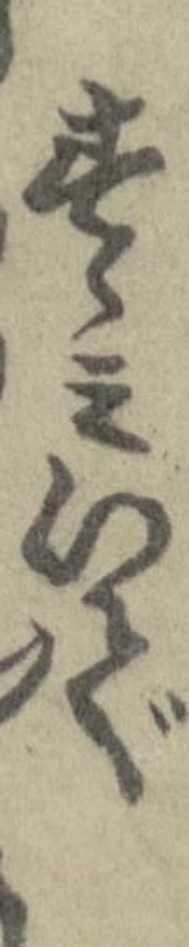すゝみいで
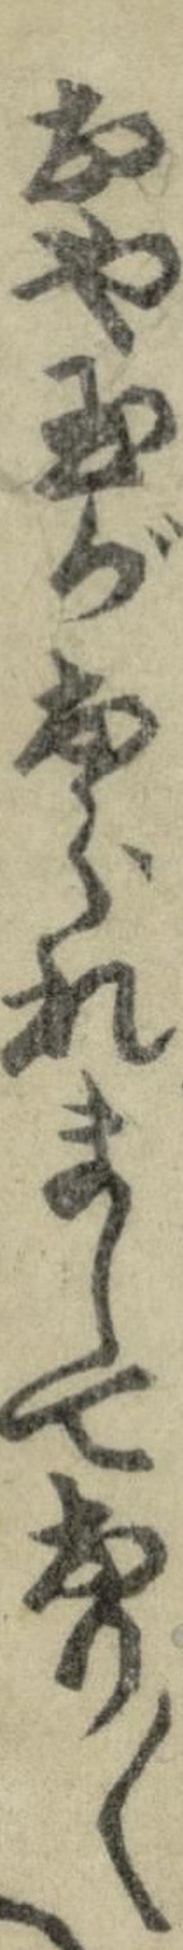おや玉がおられましており〳〵
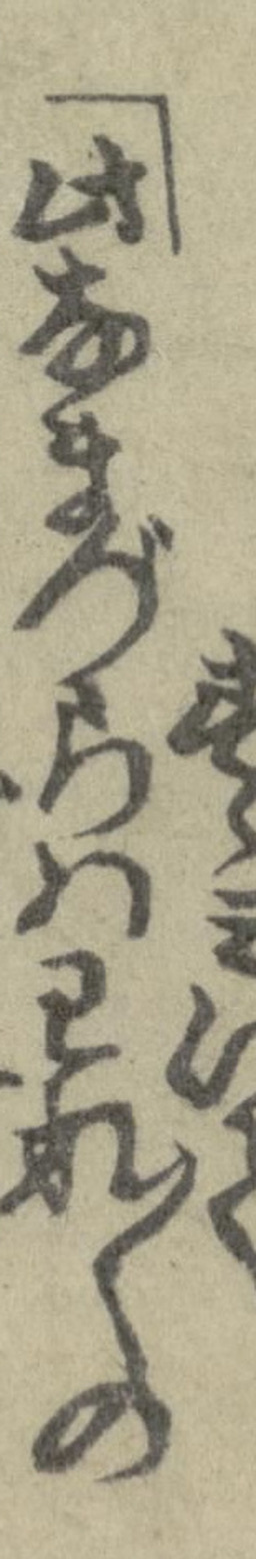〽此なまづらはわれ〳〵の
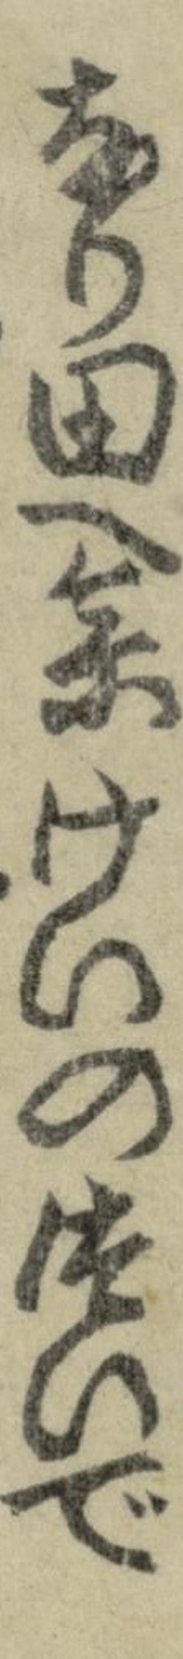なり田へ参けいのついで
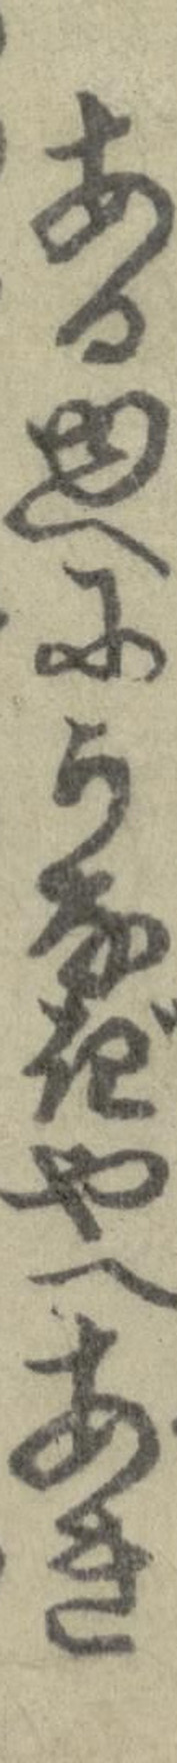あるゆへにうなぎやへあき
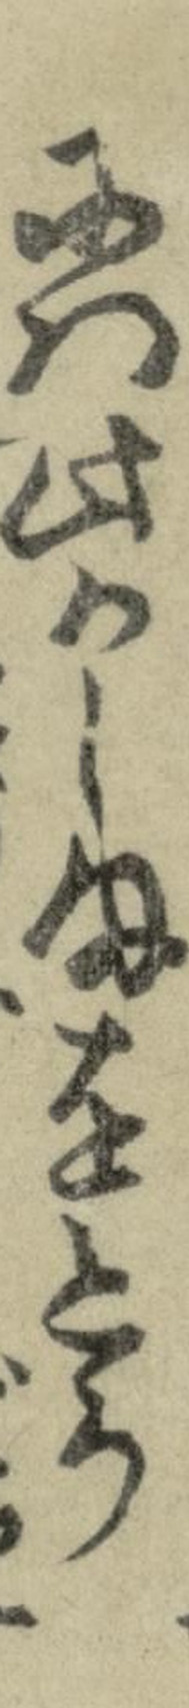には此かしまをとう
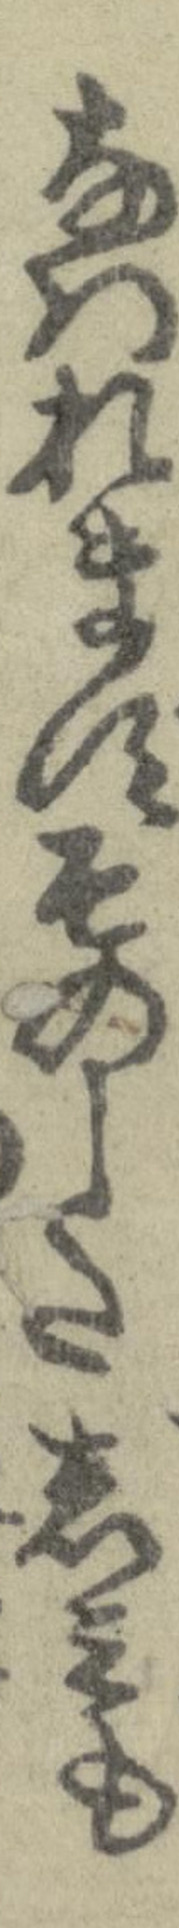なはれますそのしたしみも
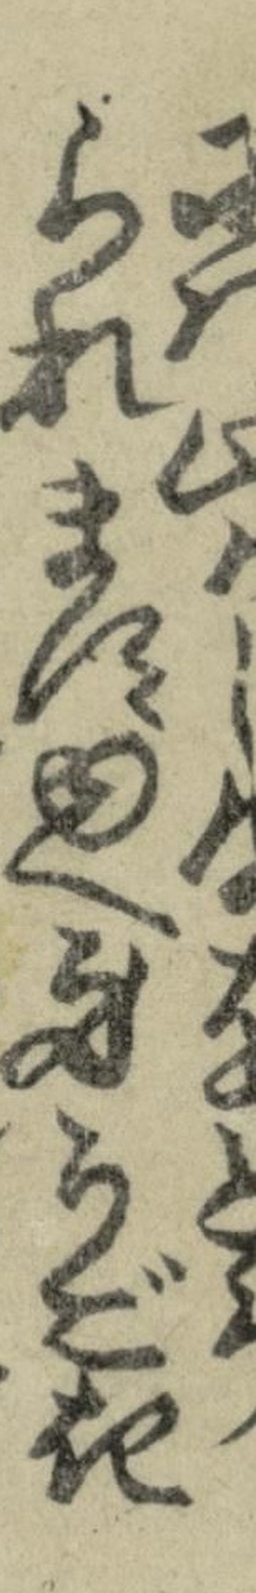られますゆへ身うごき
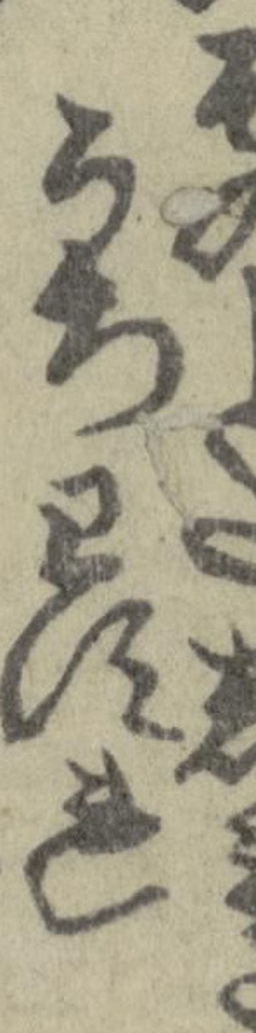うちわすれ
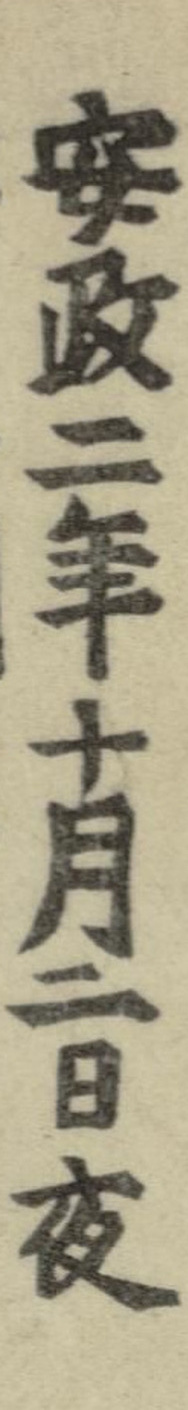安政二年十月二日夜
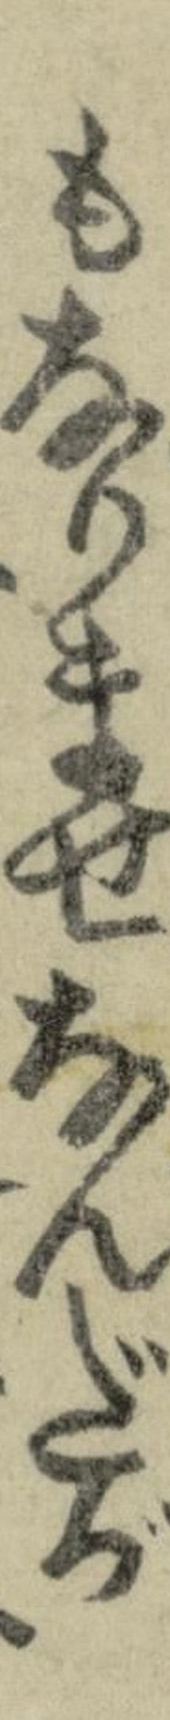もなりませんなんだが
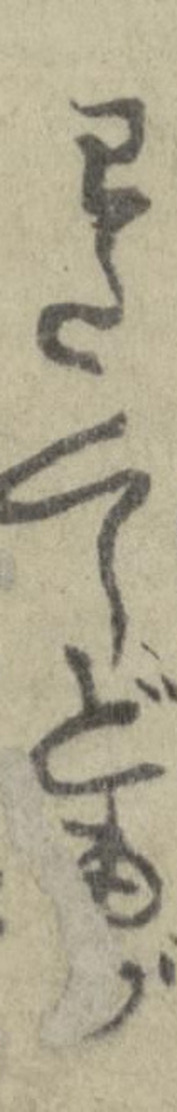わたくしども
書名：[すい神のおしえにいのちたすかりて]
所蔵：東京大学地震研究所図書室 Earthquake Research Institute Library, The University of Tokyo, JAPAN
